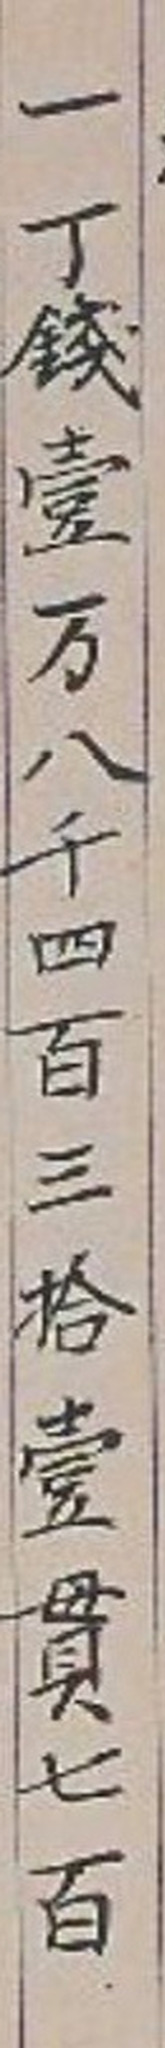一丁錢壹万八千四百三拾壹貫七百
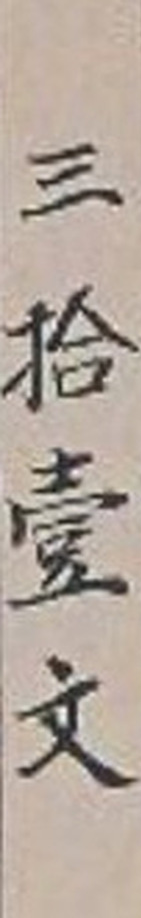三拾壹文
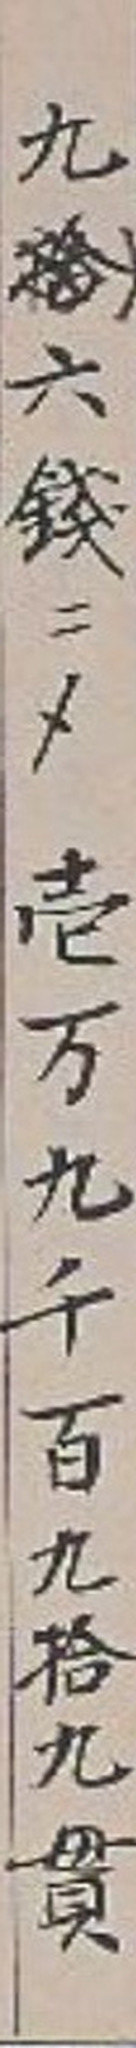九六錢ニシテ壱万九千百九拾九貫
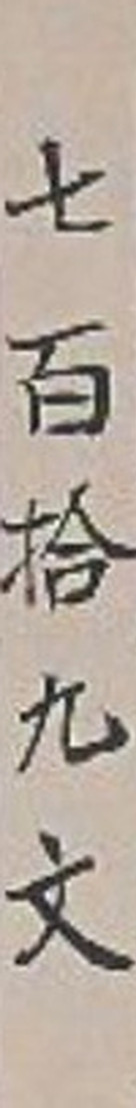七百拾九文
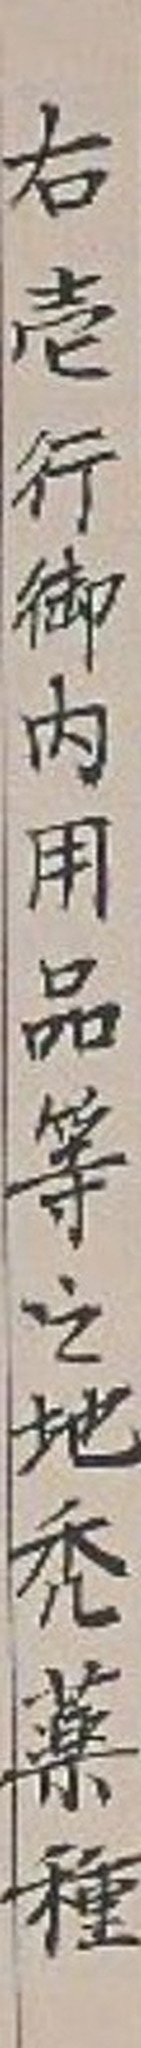右壱行脚御内用品等之地禿薬種
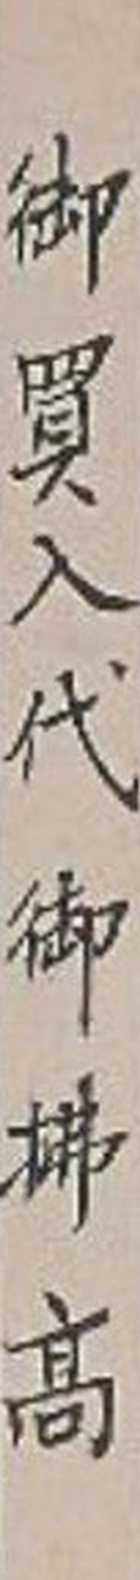御買入代御拂髙
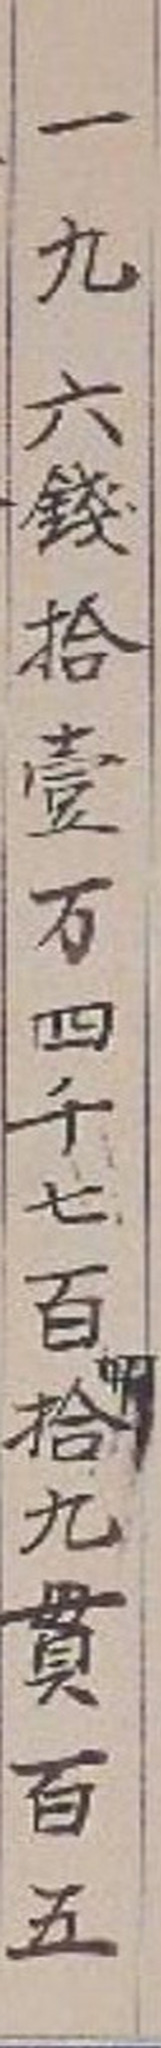一九六錢拾壹万四千七百拾九貫百五
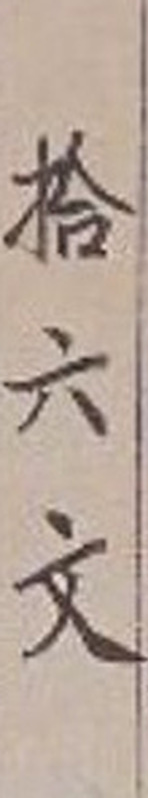拾六文
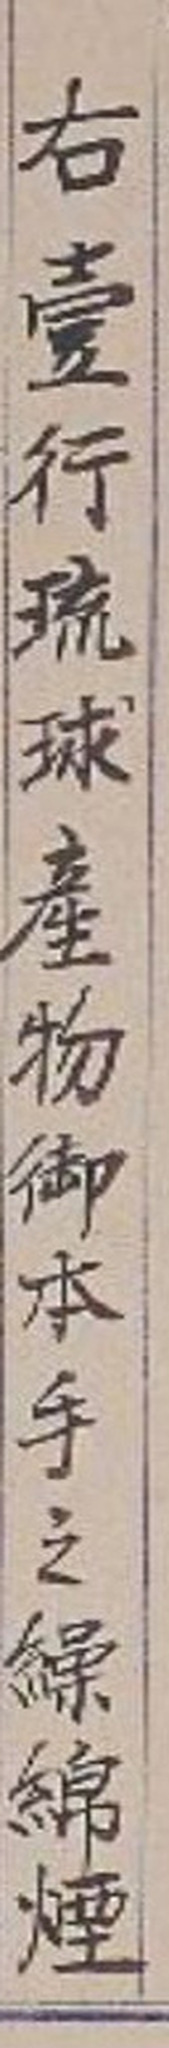右壹行琉球産物御本手之繰綿煙
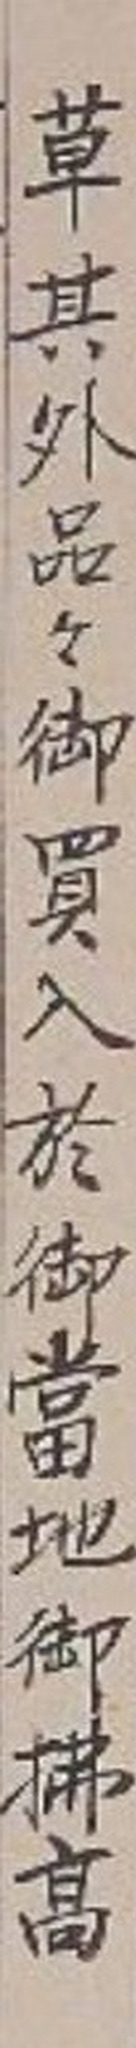草其外品々御買入於御當地御拂髙
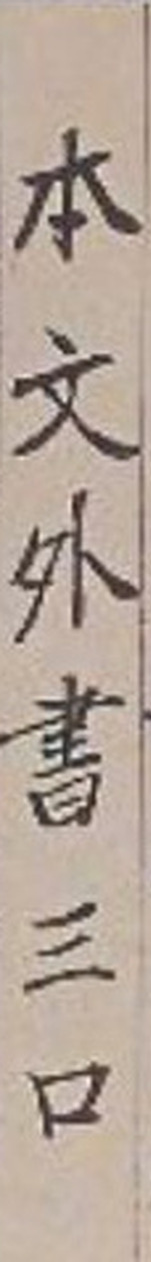本文外書三口
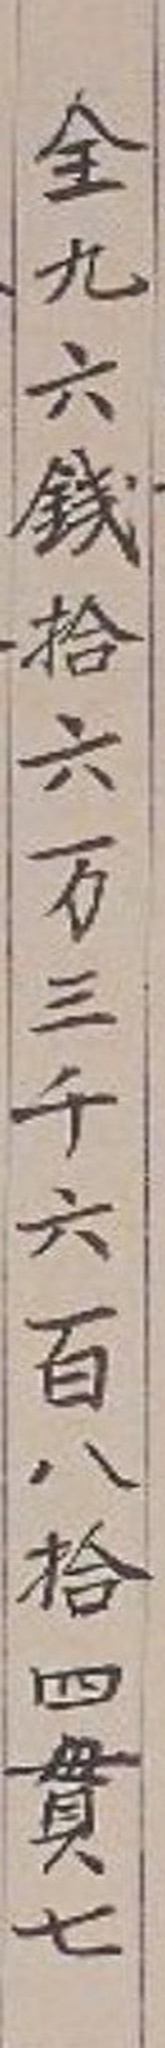全九六銭拾六万三千六百八拾四貫七
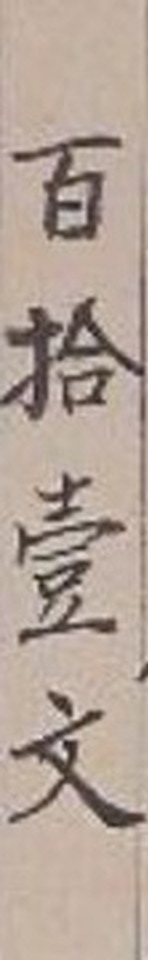百拾壹文

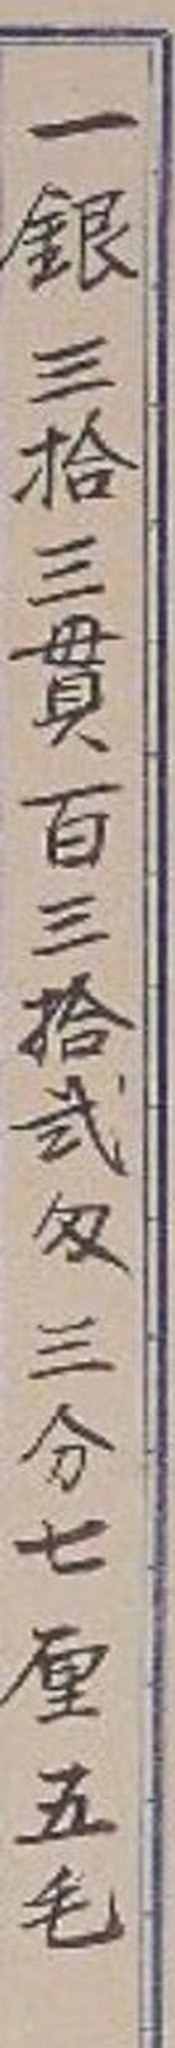一銀三拾三貫百三拾弐匁三分七厘五毛
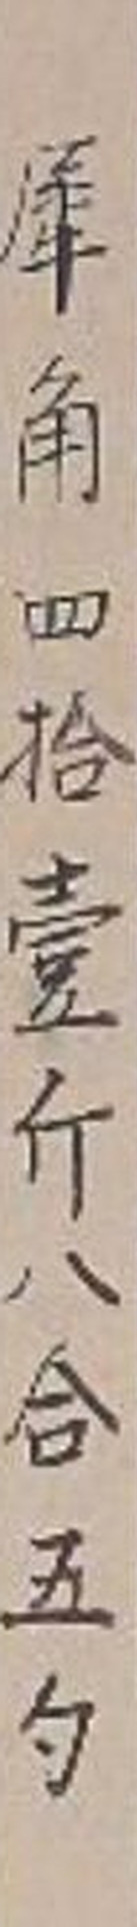犀角四拾壹斤八合五勺
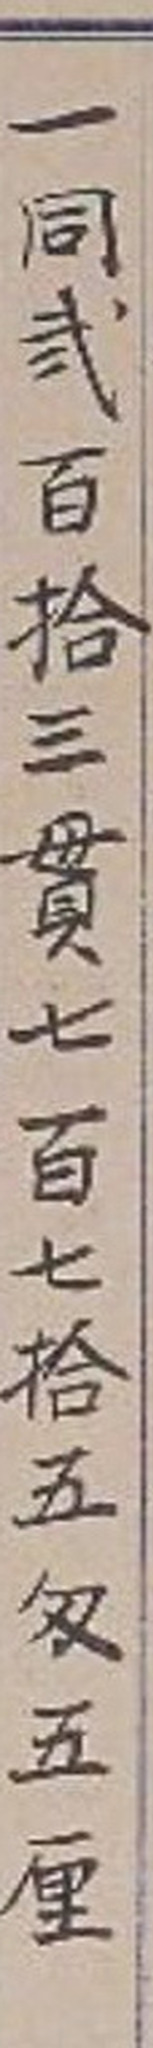一同弐百拾三貫七百七拾五匁五厘
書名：琉球産物於長崎拂立並本手品利潤総帖 弘化四年より酉年迄
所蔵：University of the Ryukyus Library
